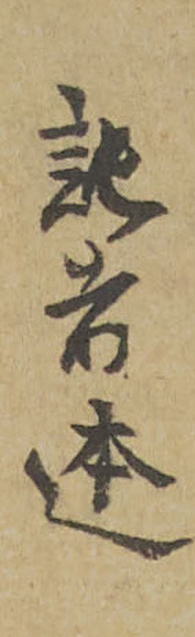記者述

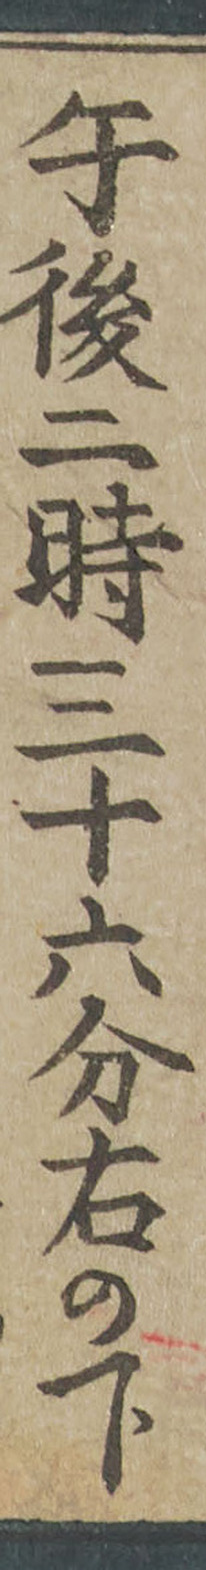午後二時三十六分右の下
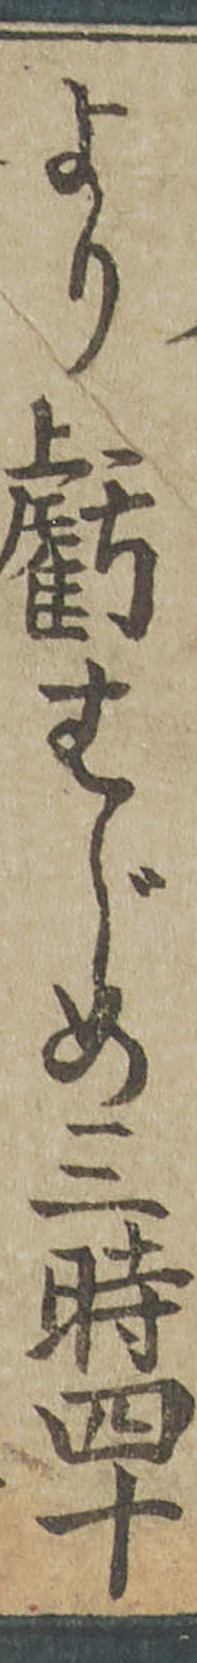より虧はじめ三時四十
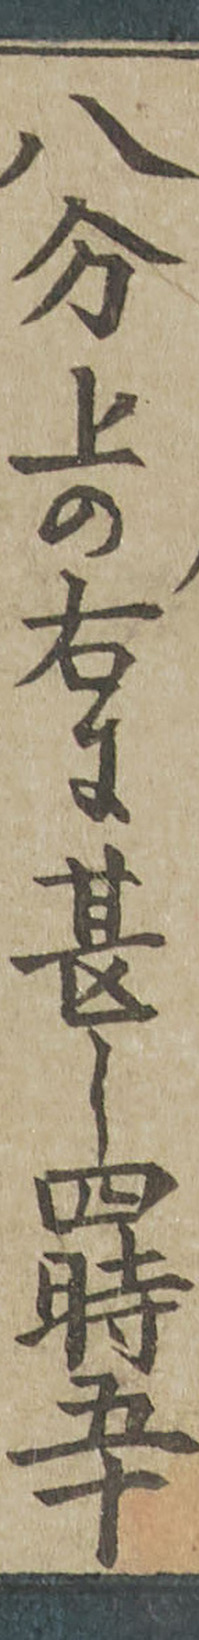八分上の右に甚し四時五十
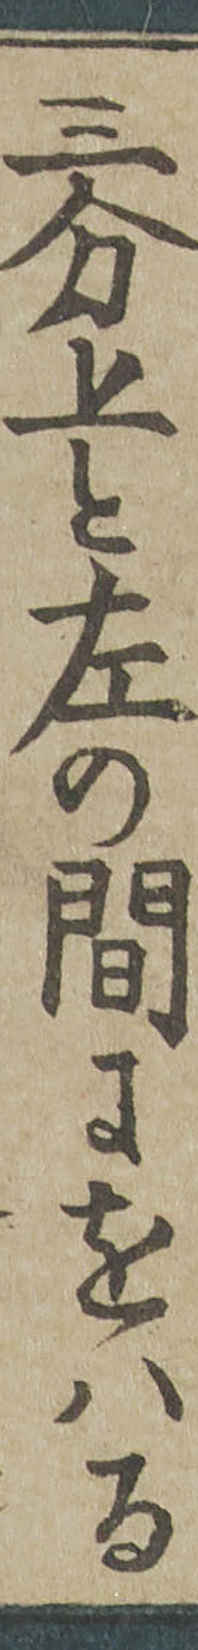三分上と左の間にをはる
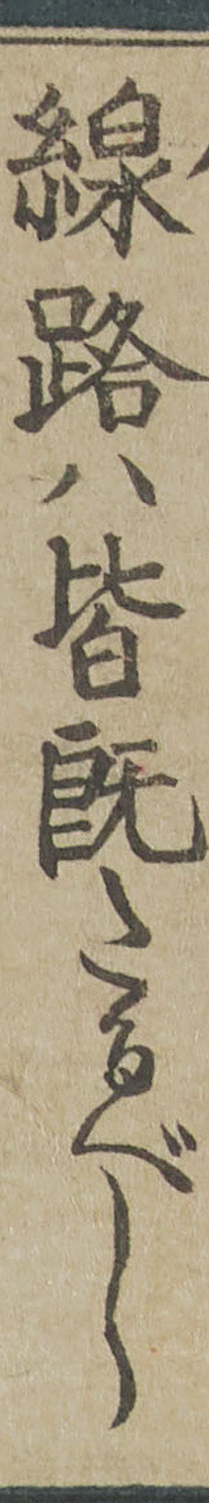線路は皆既たるべし
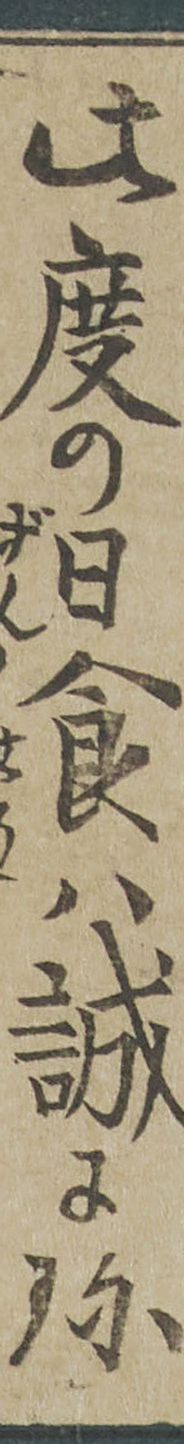此度の日食は誠に珎
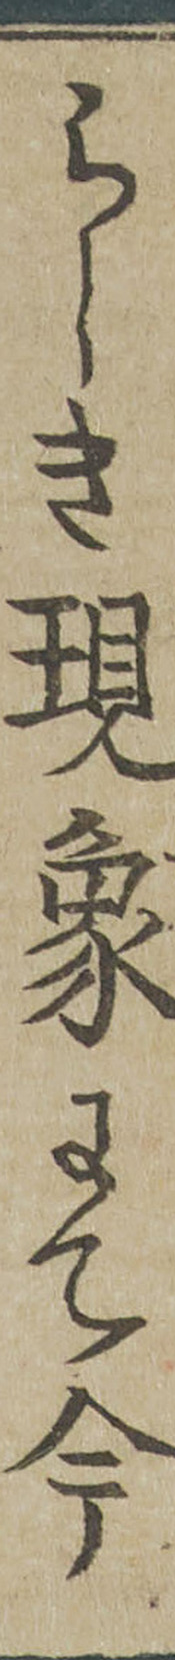らしき現象にて今
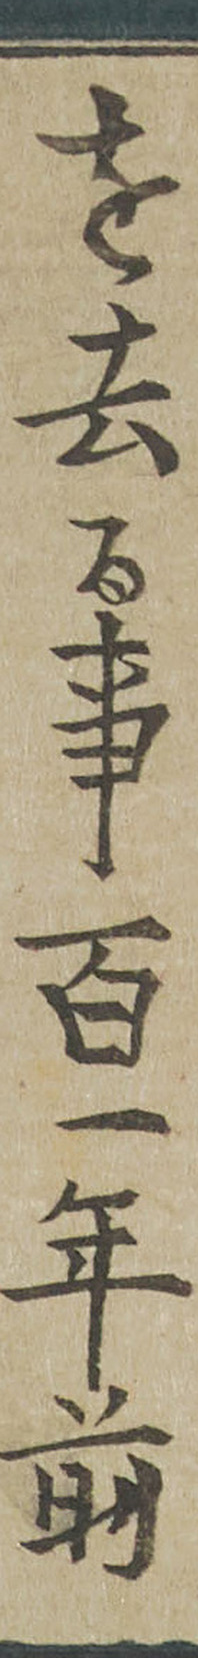を去る事百一年前
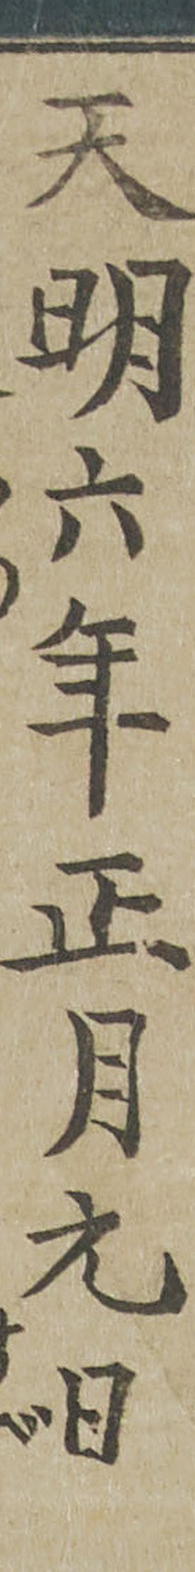天明六年正月元日
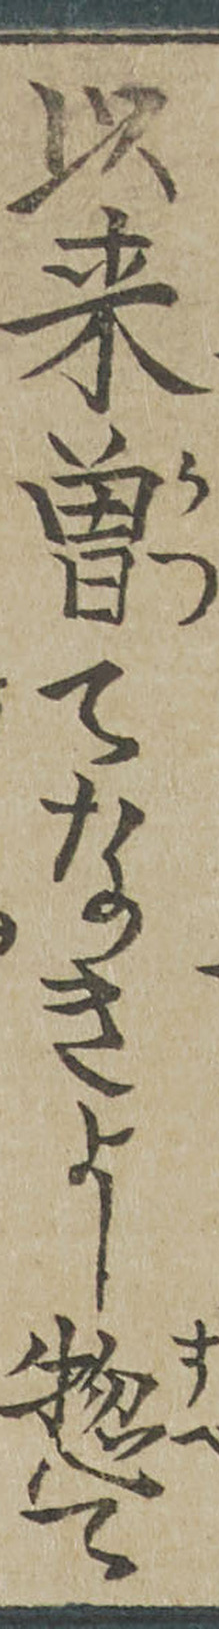以来曽てなきよし惣て
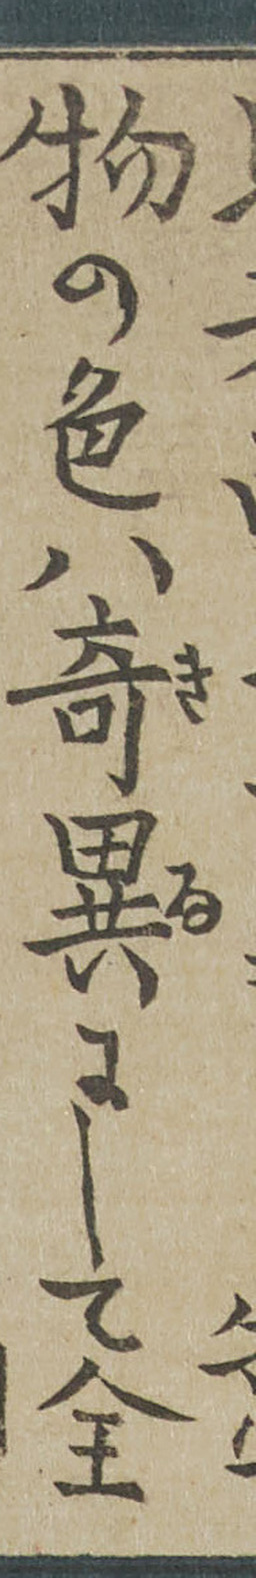物の色は奇異にして全
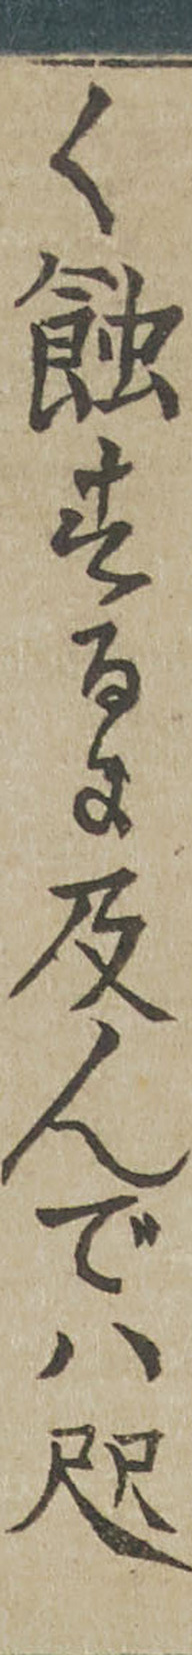く蝕するに及んでは咫
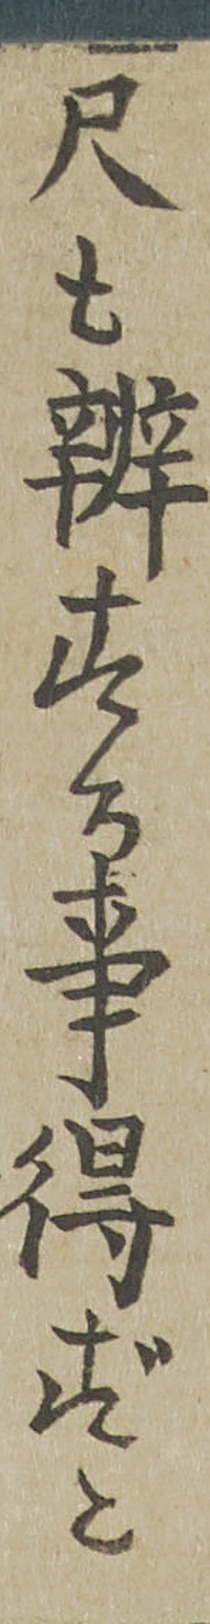尺も辨する事得ずと
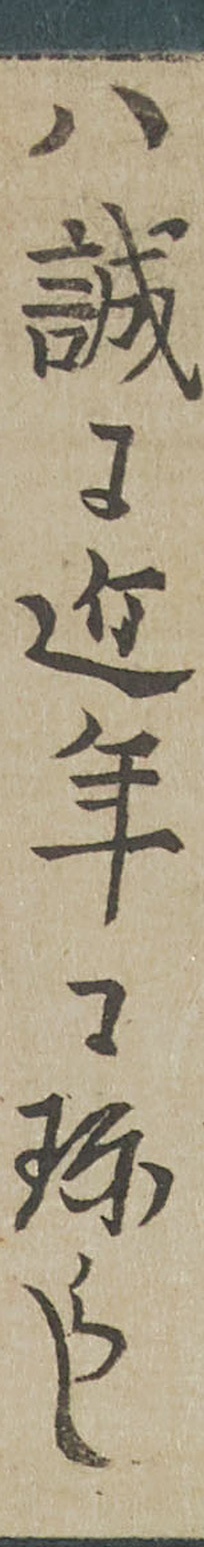は誠に近年に珎らし
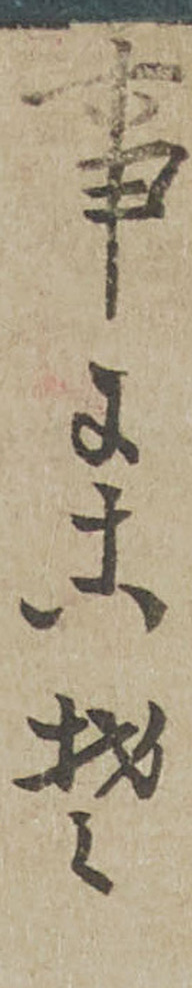事にこそ
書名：明治二十歳八月十九日日食九分九厘余
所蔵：東京大学総合図書館 General Library in the University of Tokyo, JAPAN
